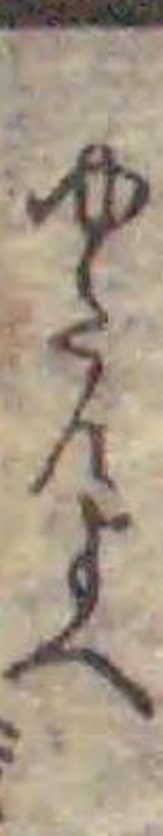ゆたんすへ
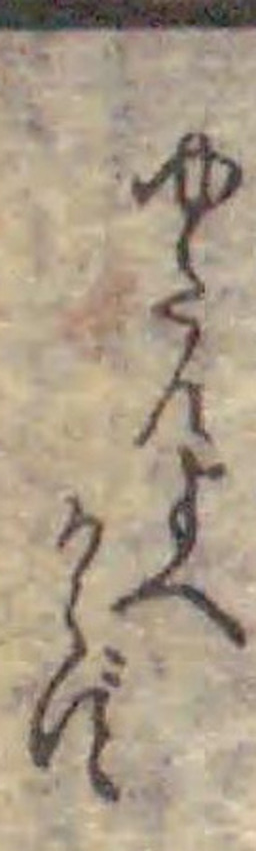からず

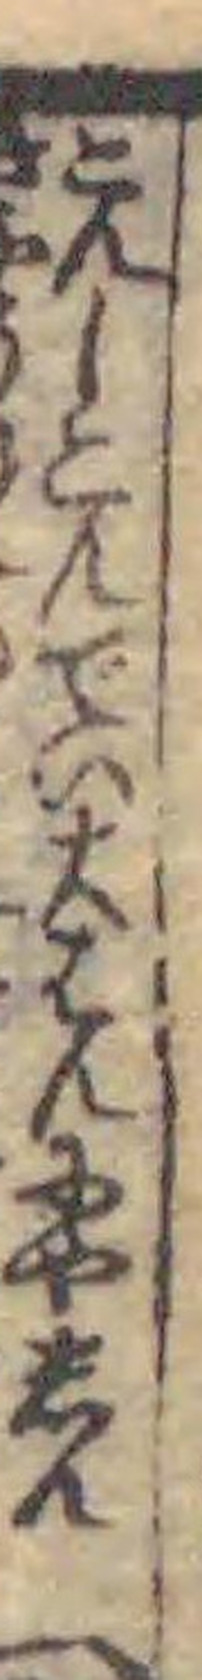こんしこんでい大はんにやしん
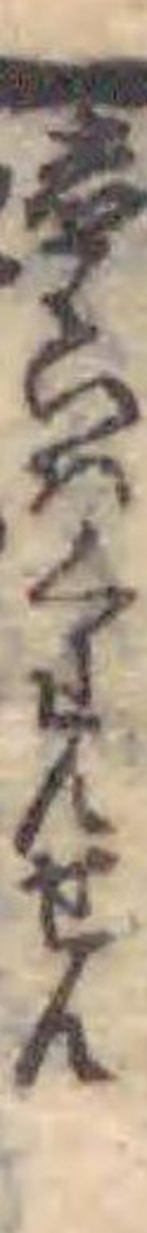しはいはくわんせん
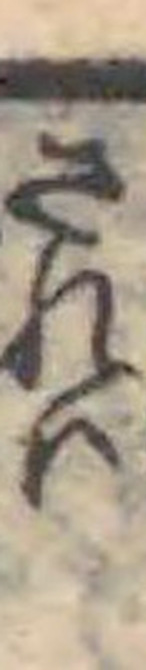されは
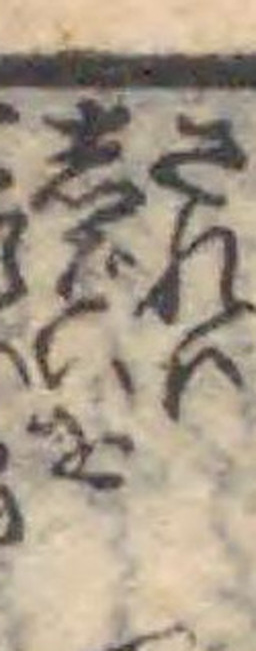しばいを
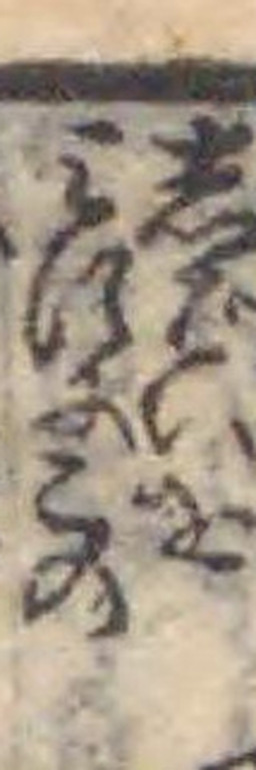みすにこの
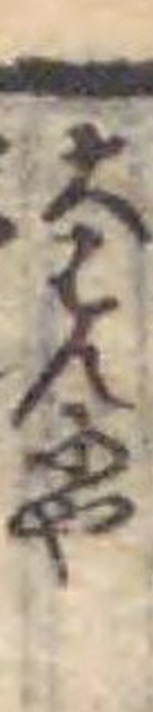大はんにや
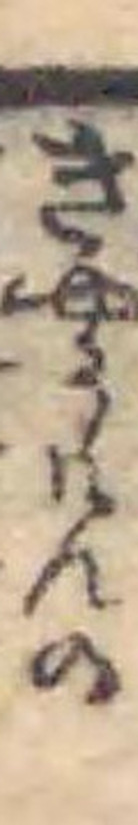きやうけんの
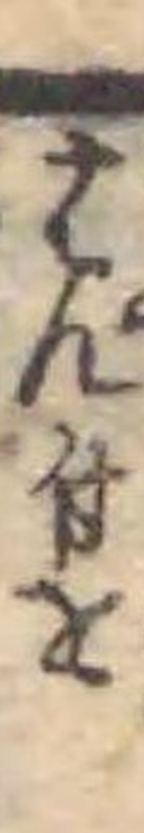はん付を
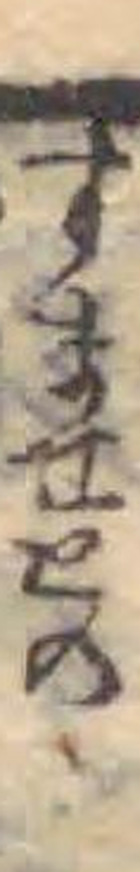すませとの
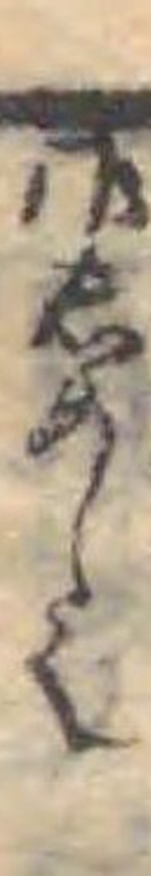御しめし也
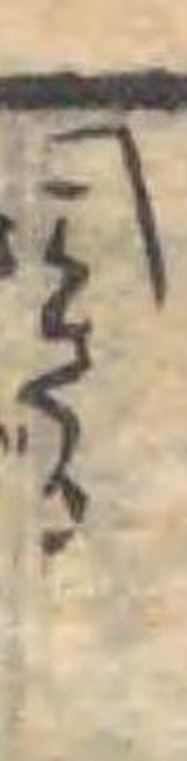〽みさる
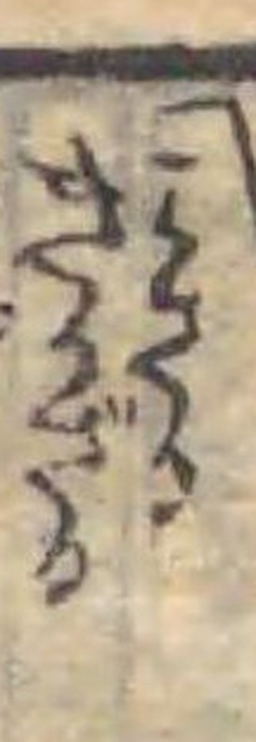きかざる
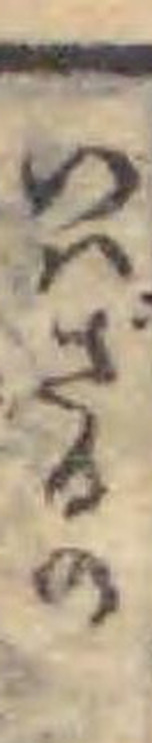いはざるの
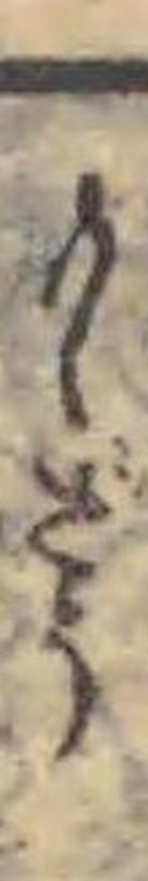もくざう
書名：身体開帳略縁起 : 3巻
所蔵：国立国会図書館 National Diet Library, JAPAN
